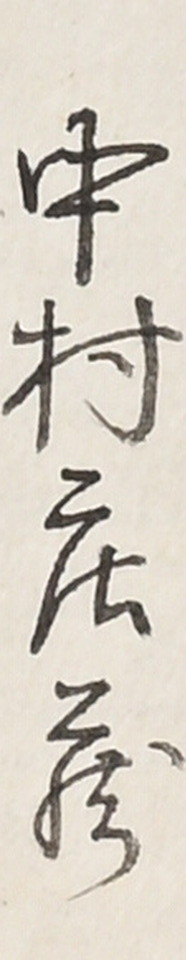中村庄蔵
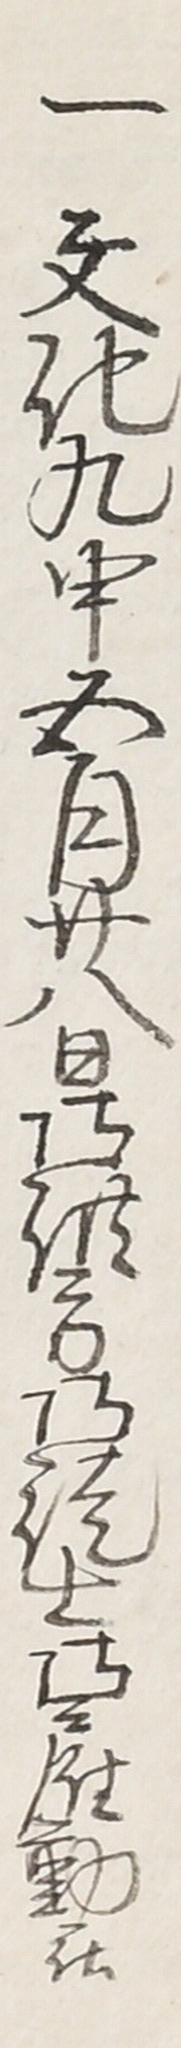一文化九申五月廿八日御供方御徒士御雇勤被
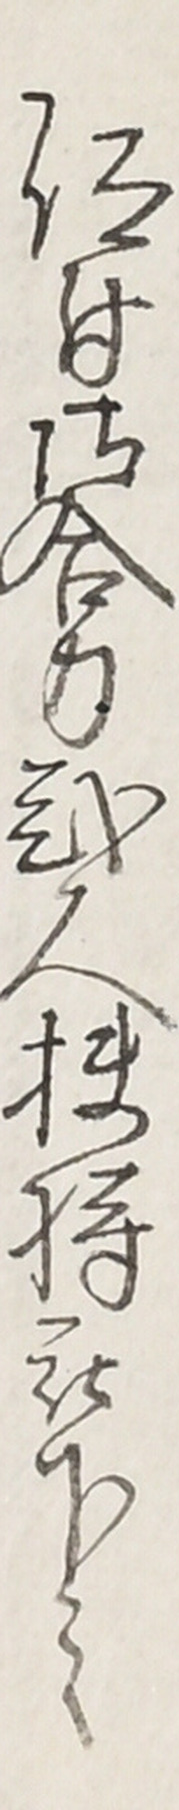仰付御合力弐人扶持被下之
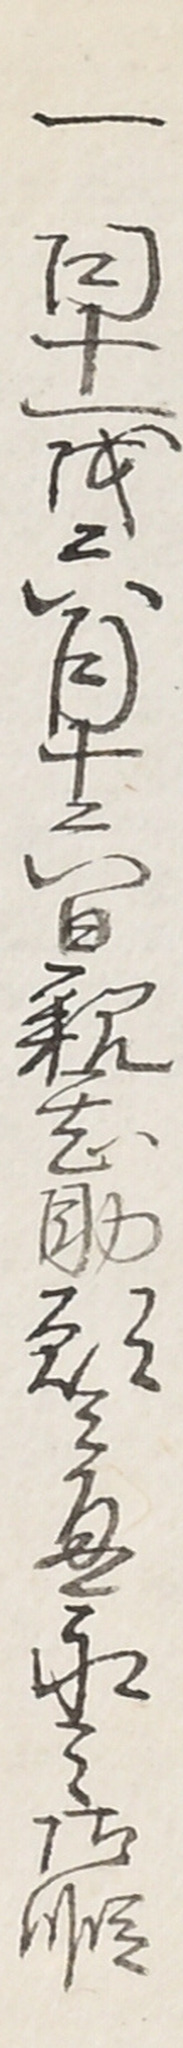一同十一戊六月十六日親甚助願願之通永之御暇
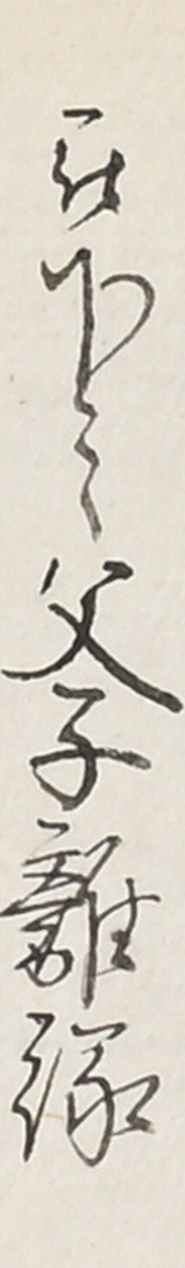被下之父子離縁
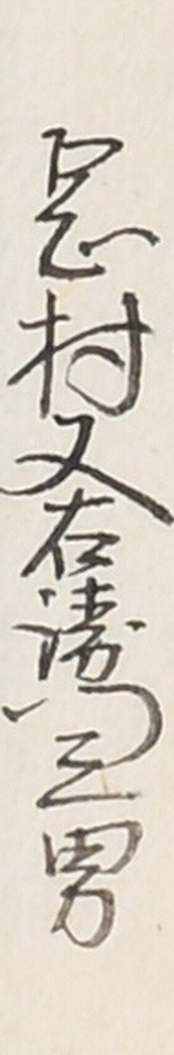岡村又右衛門三男
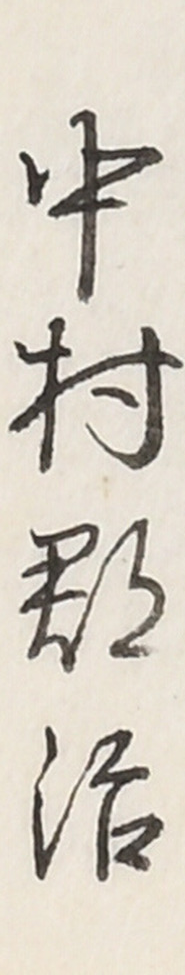中村郡治
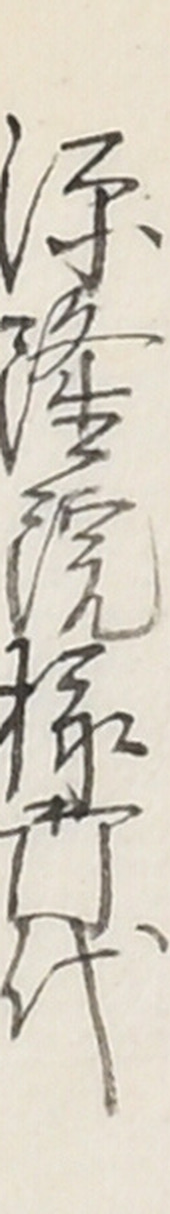源隆院様御代
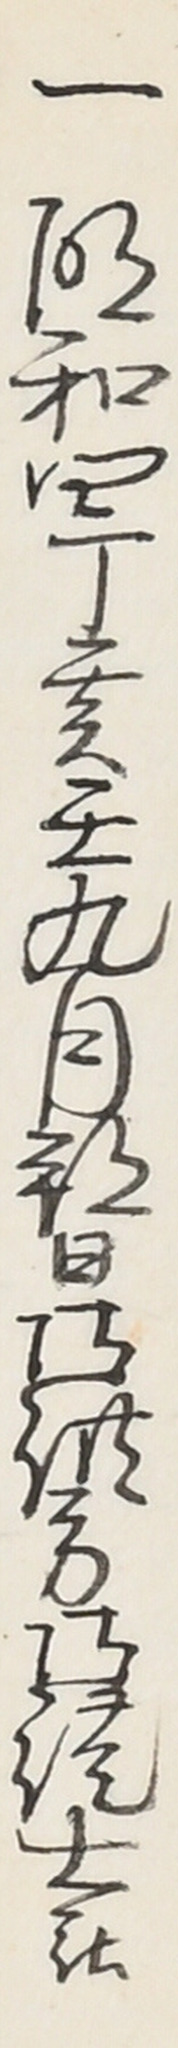一明和四丁亥閏九月ついｔ朔日御供方御徒士被
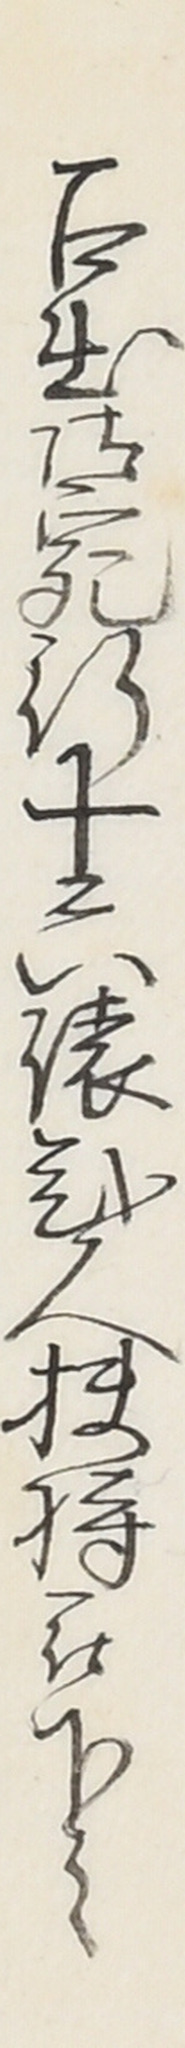召出御宛行十六俵弐人扶持被下之
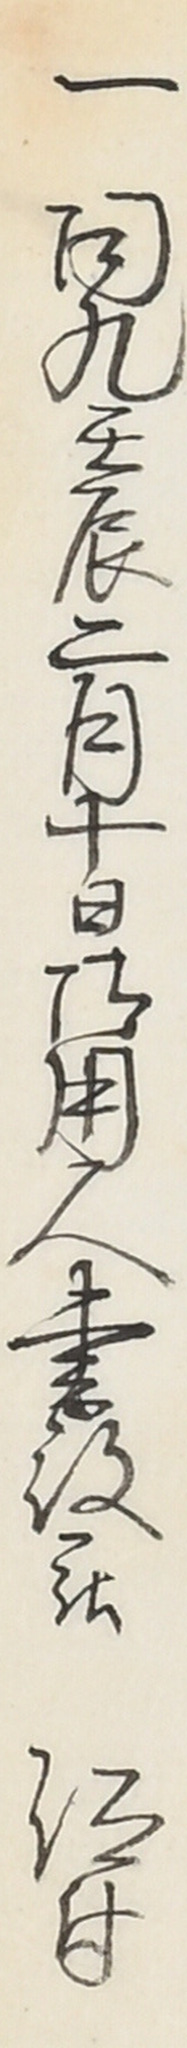一同九壬辰二月十日御用人書役被仰付
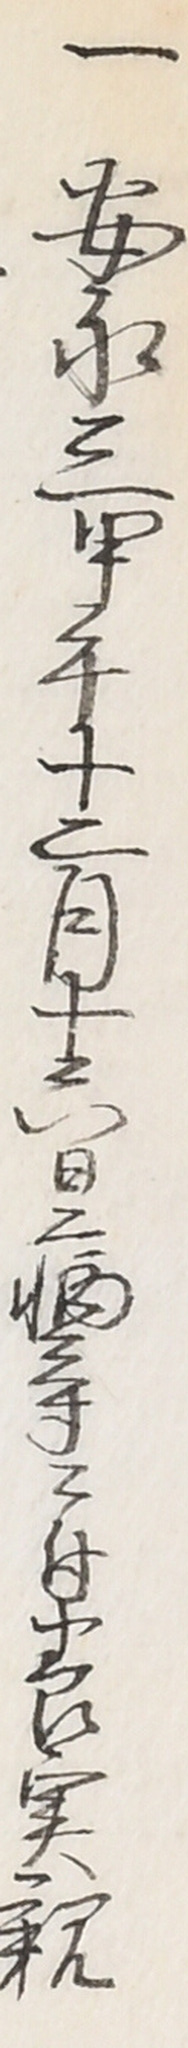一安永三甲午中に十二月十六日病気ニ付養実親
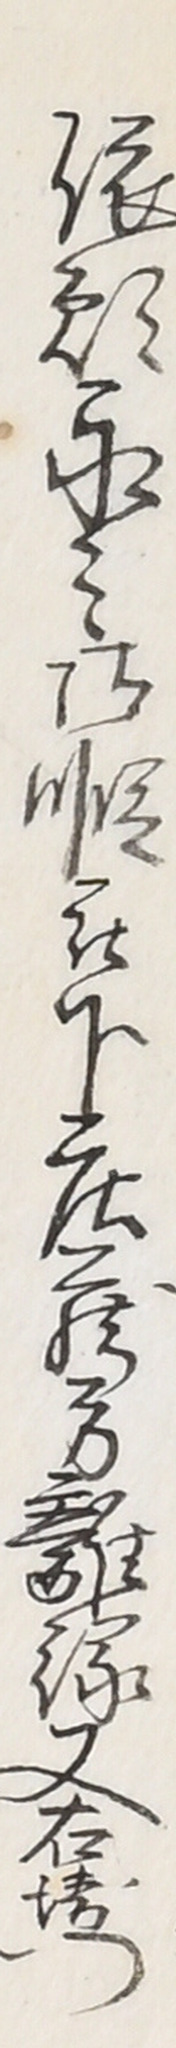依願永之御暇被下庄蔵方離縁又右衛門
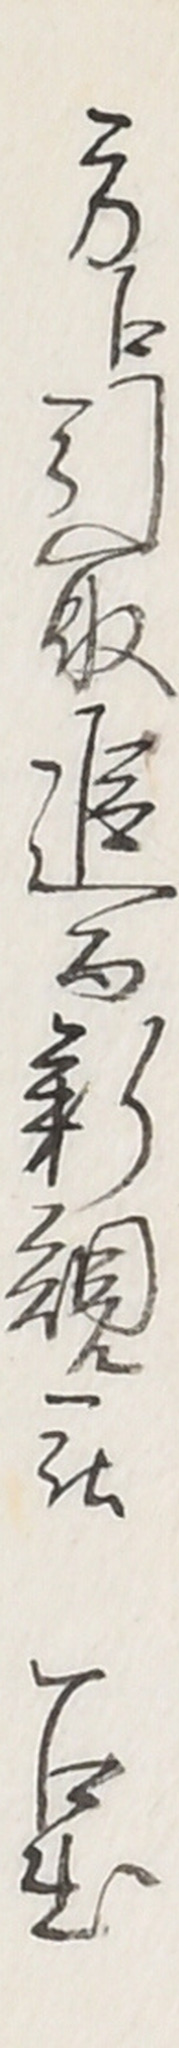方江引取追而新規被召出
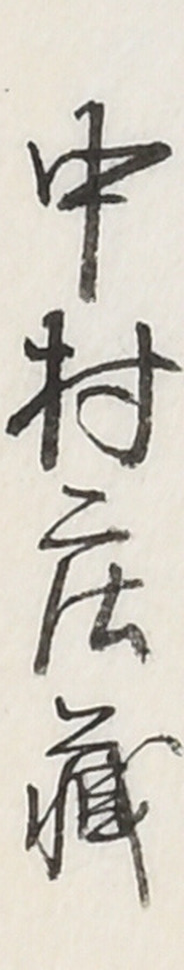中村庄蔵
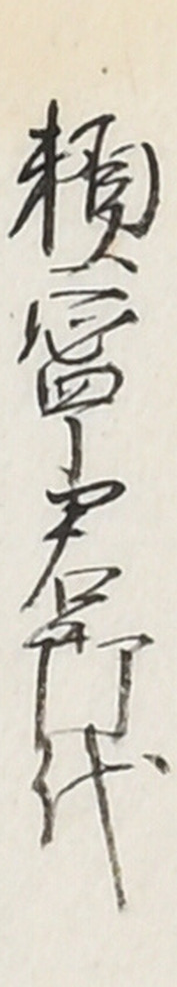頼寧君御代
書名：給人諸士勤仕録（七）
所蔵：伊那市立高遠町図書館・合同会社AMANE
